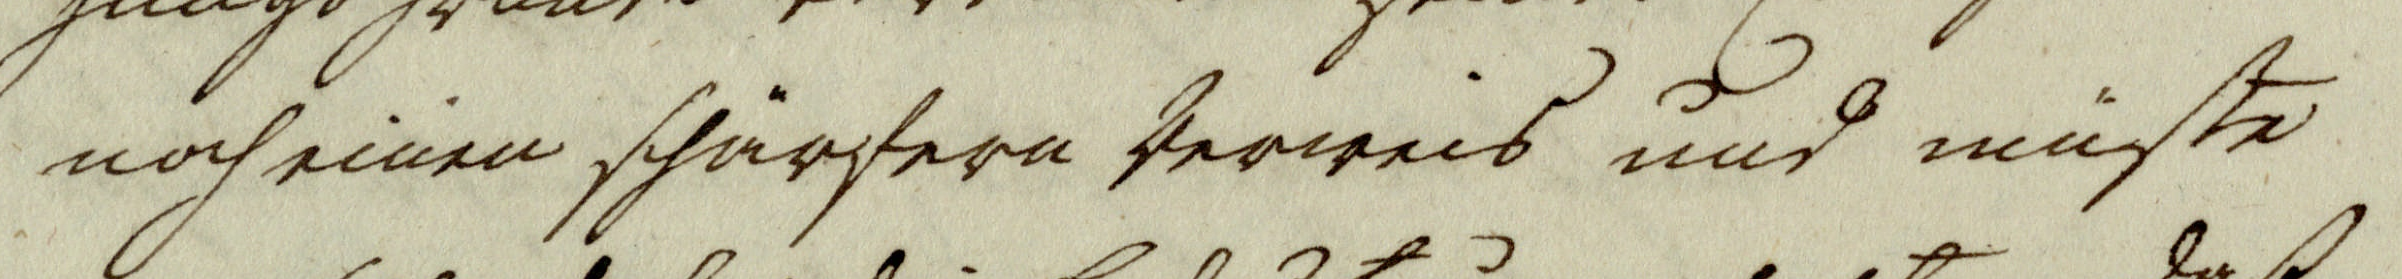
noch einen schärfern Verweis und müßte
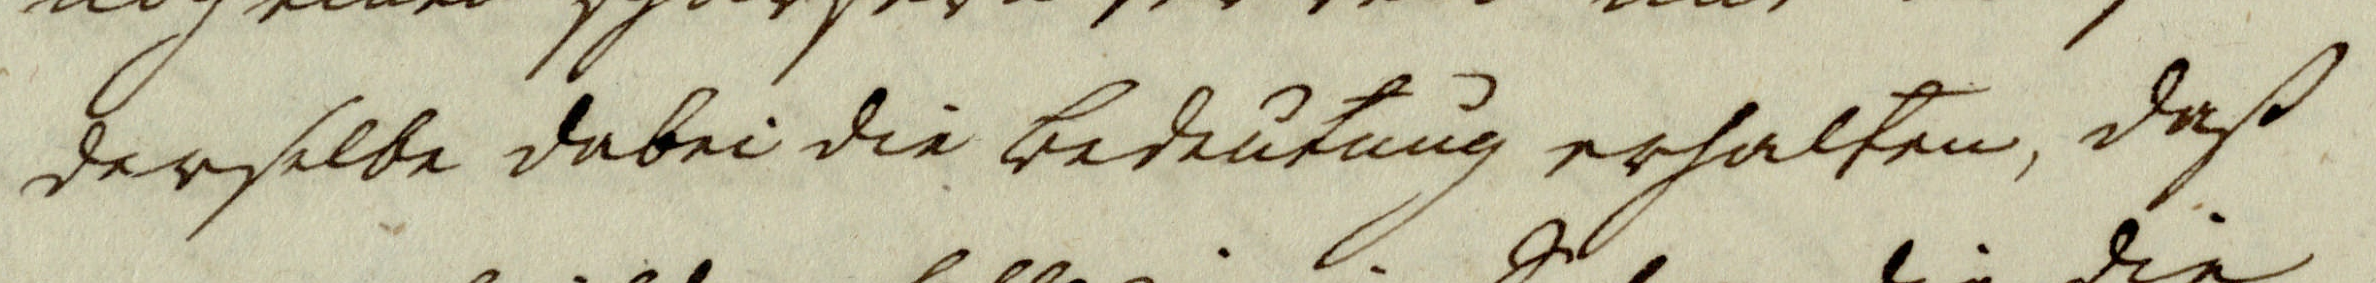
derselbe dabei die Bedeutung erhalten, daß
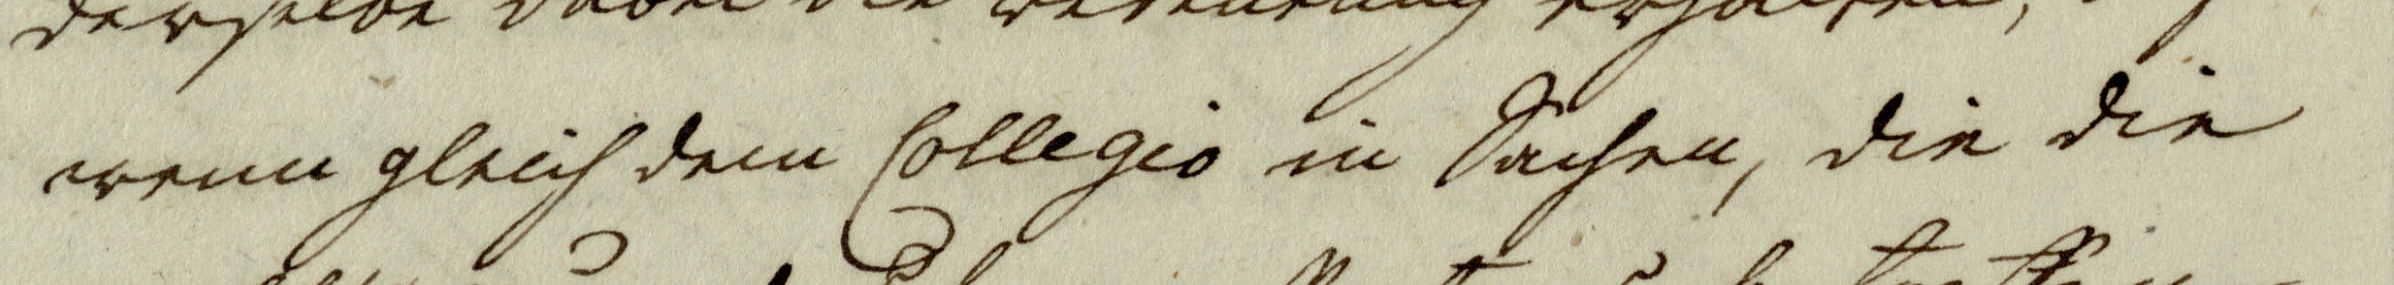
wenn gleich dem Collegio in Sachen, die die
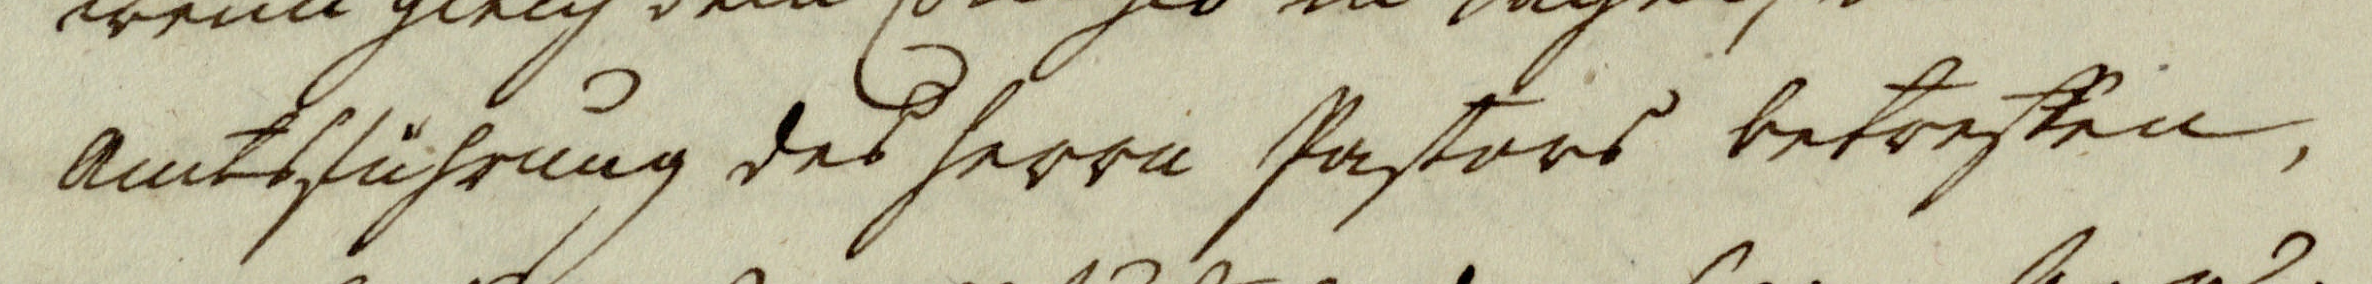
Amtsführung des Herrn Pastors betreffen,
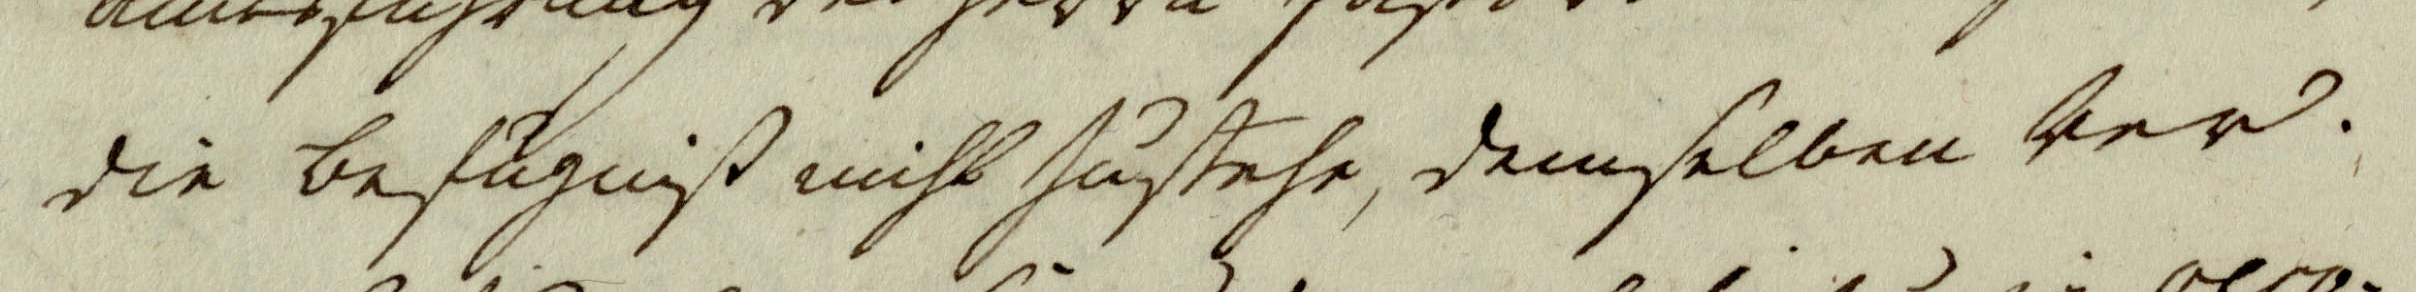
die Befugniß nicht zustehe, demselben Ver¬
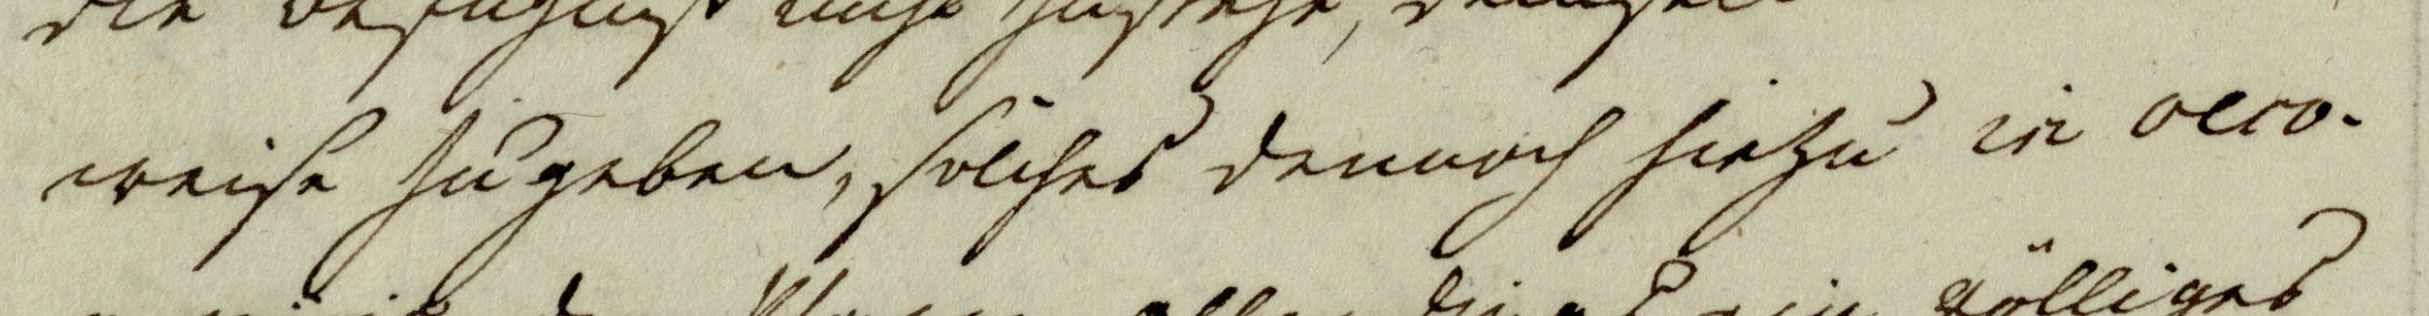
weise zu geben, solches dennoch hiezu in oeco¬
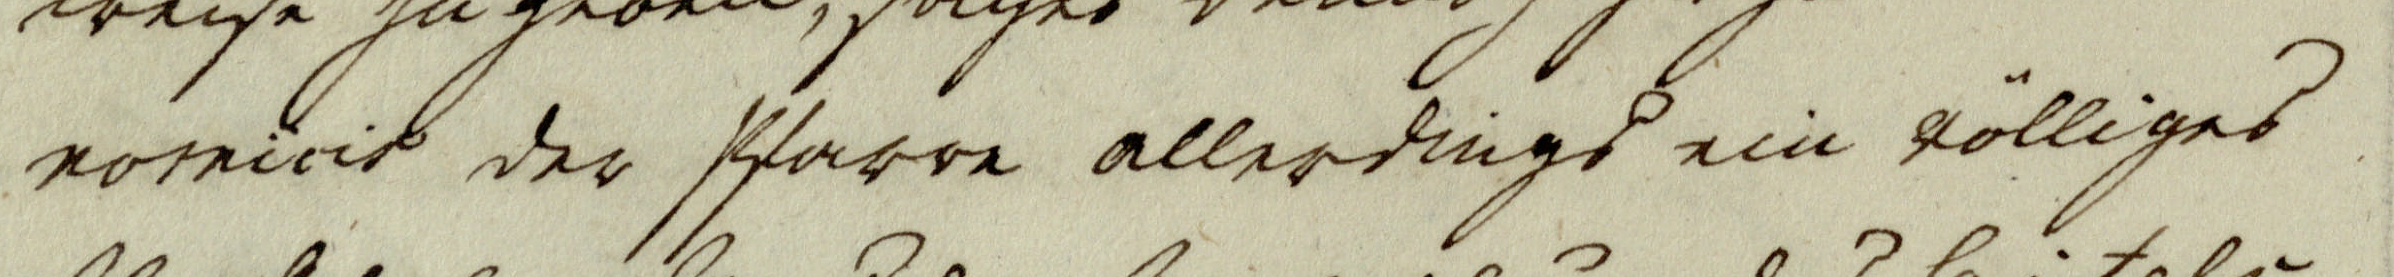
nomicis der Pfarre allerdings ein völliges
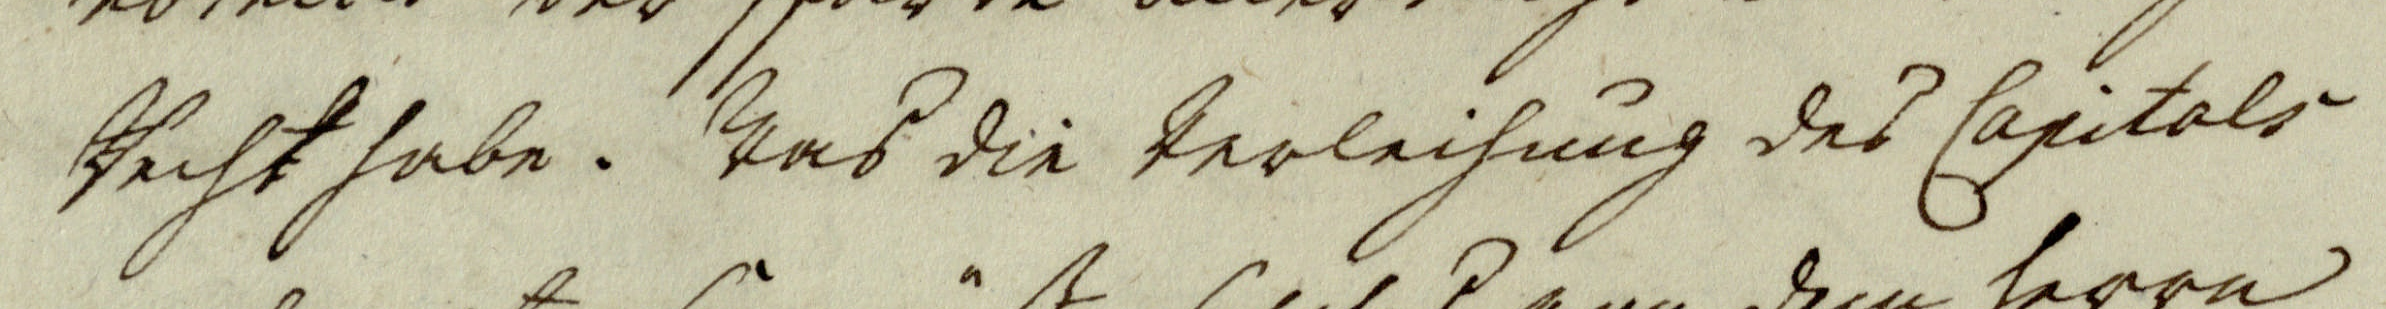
Recht habe. Was die Verleihung des Capitals
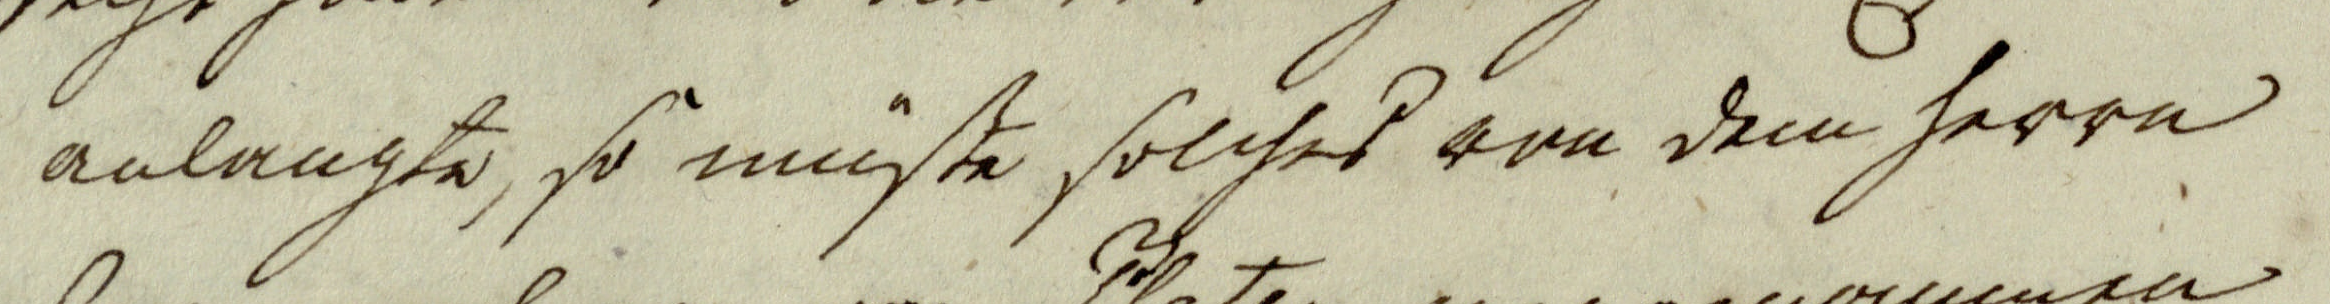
anlangte, so müßte solches von dem Herrn
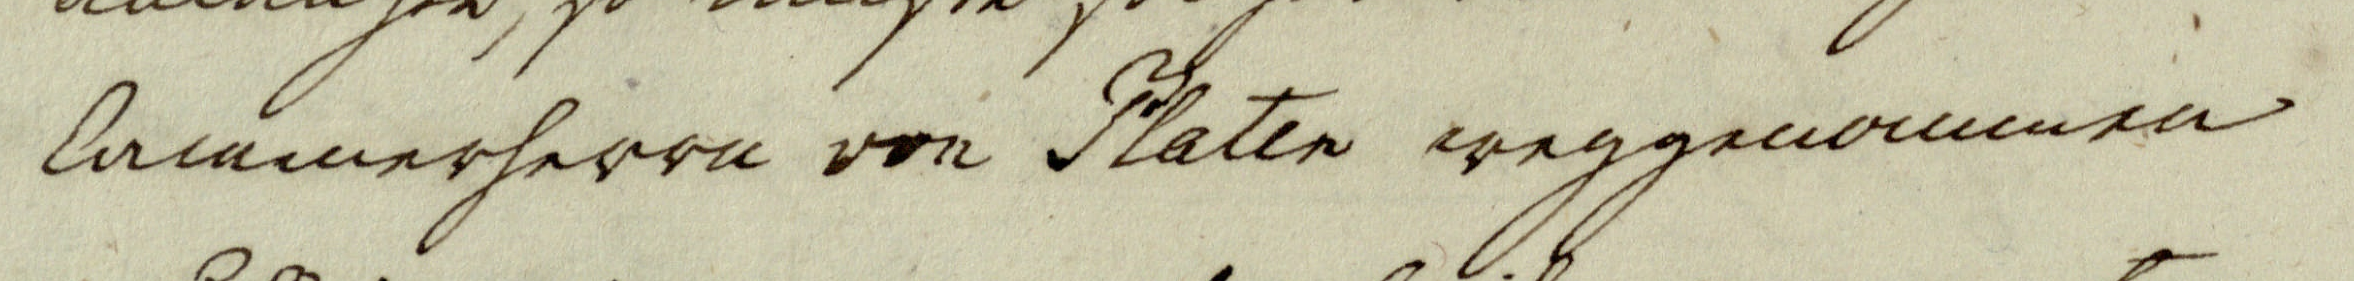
Cammerherrn von P ten weggenommen
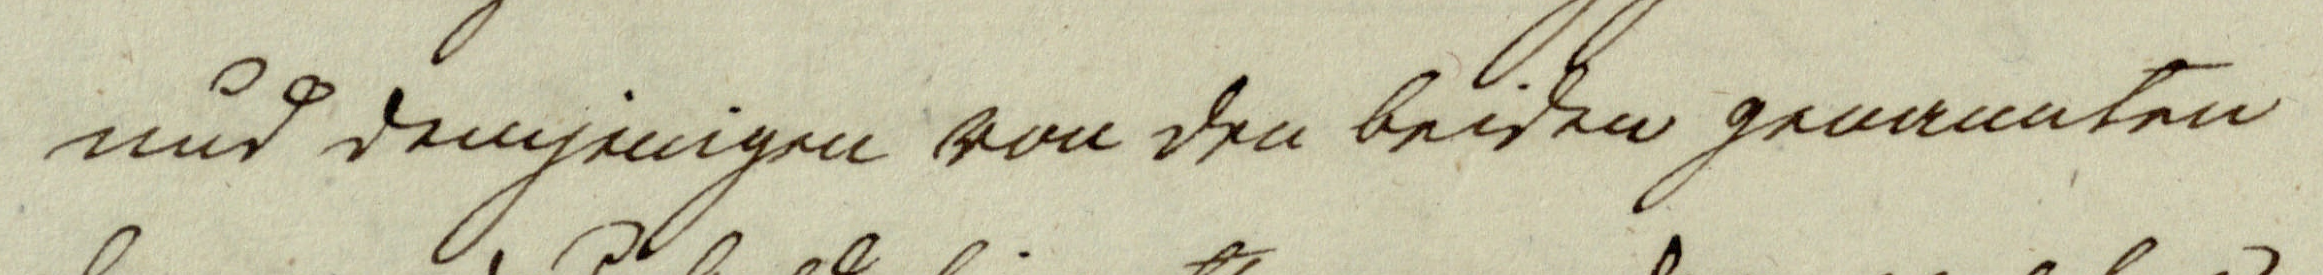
und demjenigen von den beiden genannten
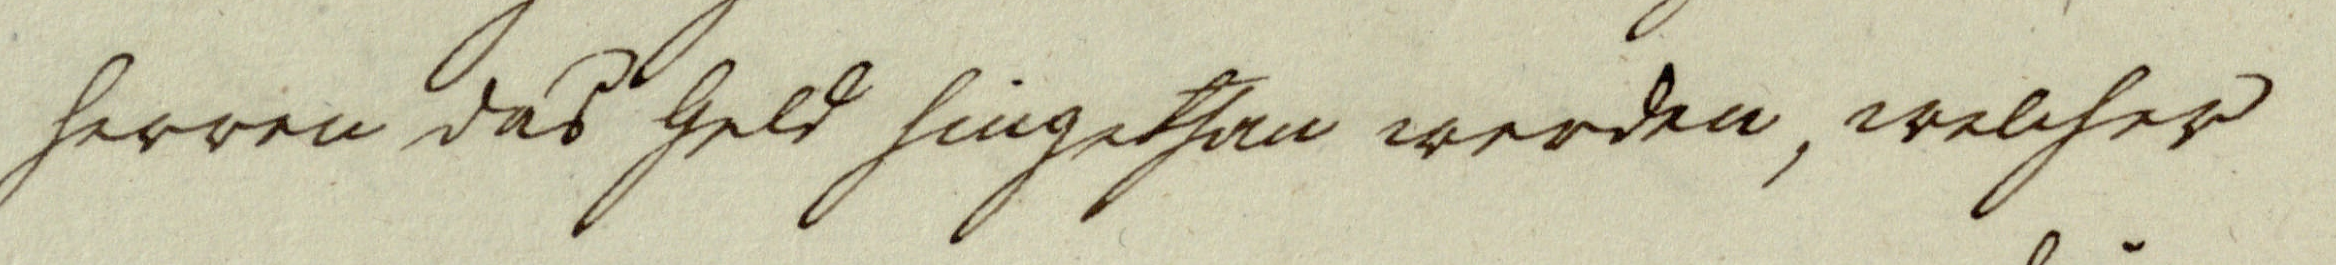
Herren das Geld hingethan werden, welcher
